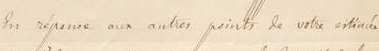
En réponse aux autres points de votre estimée
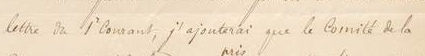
lettre du 1r Courant, j'ajouterai que le Comité de la
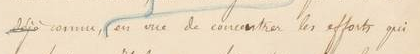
un arrangement en vue de concentrer les efforts qui
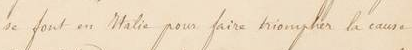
se font en Italie pour faire triompher la cause
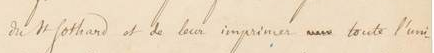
du St Gothard et de leur imprimer une toute l'uni-
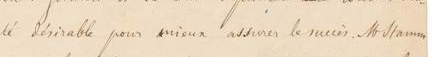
té désirable pour mieux assurer le succès. M Stamm
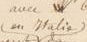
en relation
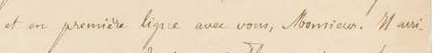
et en première ligne ave vous, Monsieur. Il arri -
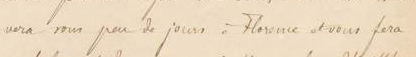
vera sous peu de jours à Florence et vous fera
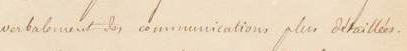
verbalement des communications plus détaillées.
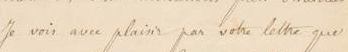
Je vois avec plaisir par votre lettre que
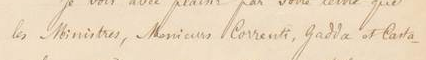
les Ministres, Monsieurs Correnti, Gadda et Casta -
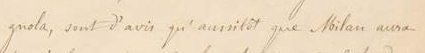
gnola, sont d'avis qu'aussitôt que Milan aura
